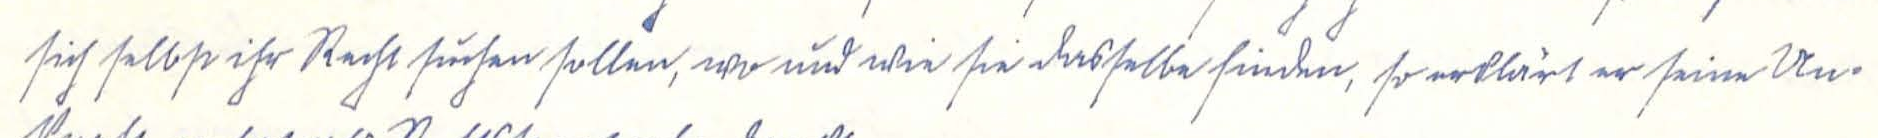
sich selbst ihr Recht suchen sollen, wo und wie sie dasselbe finden, so erklärt er seine Un-
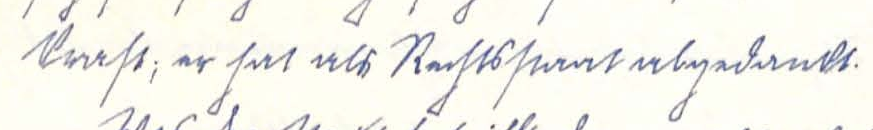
kraft; er hat als Rechtsstaat abgedankt.
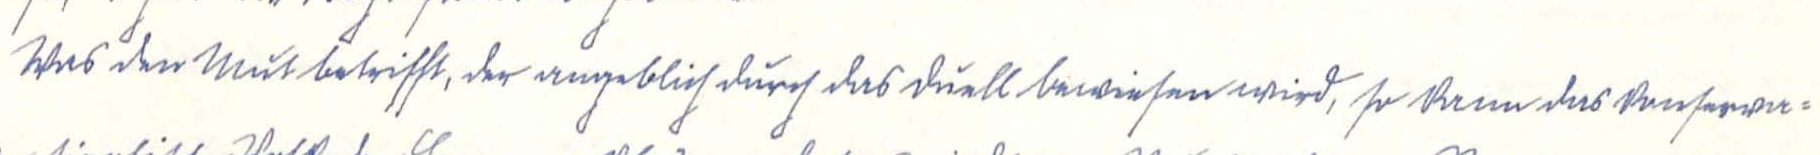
Was den Mut betrifft, der angeblich durch das Duell bewiesen wird, so kann das konserva-
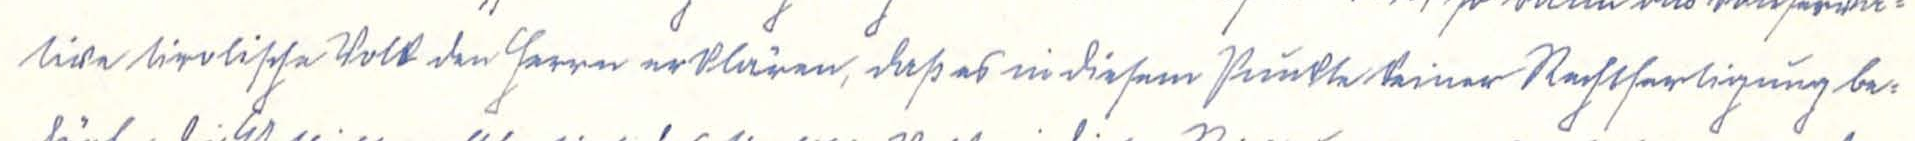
tive tirolische Volk den Herrn erklären, daß es in diesem Punkte keiner Rechtfertigung be-
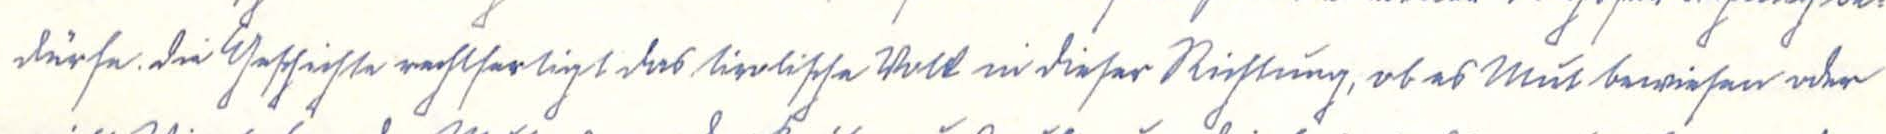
dürfe. Die Geschichte rechtfertigt das tirolische Volk in dieser Richtung, ob es Mut bewiesen oder
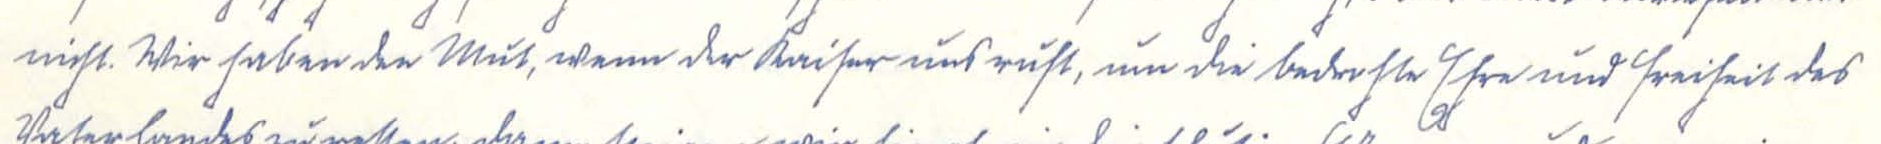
nicht. Wir haben den Mut, wenn der Kaiser uns ruft, um die bedrohte Ehre und Freiheit des
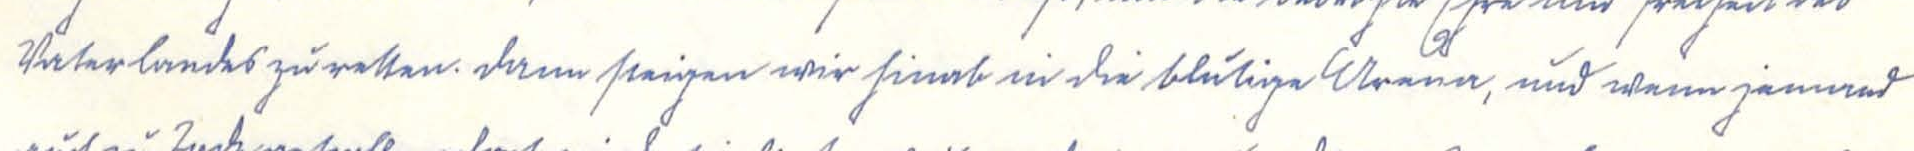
Vaterlandes zu retten. Dann steigen wir hinab in die blutige Arena, und wenn jemand
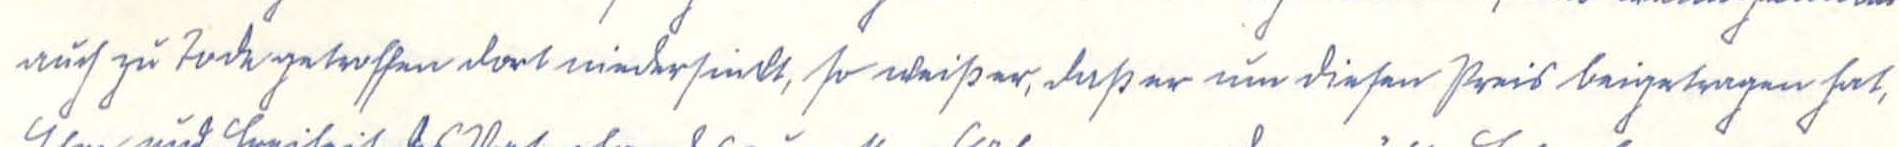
auch zu Tode getroffen dort niedersinkt, so weiß er, daß er um diesen Preis beigetragen hat,
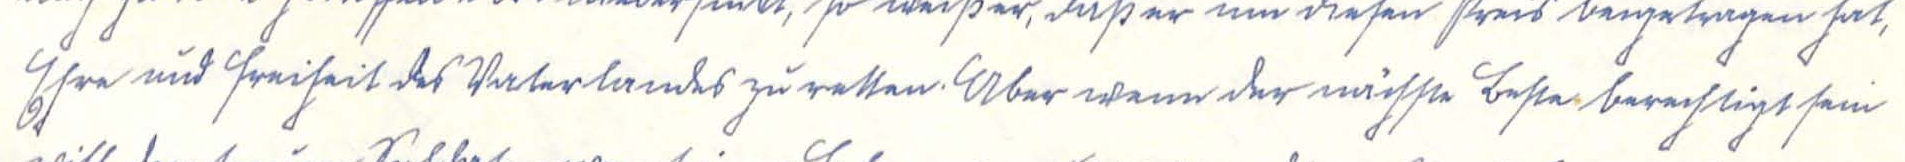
Ehre und Freiheit des Vaterlandes zu retten. Aber wenn der nächste Beste berechtigt sein
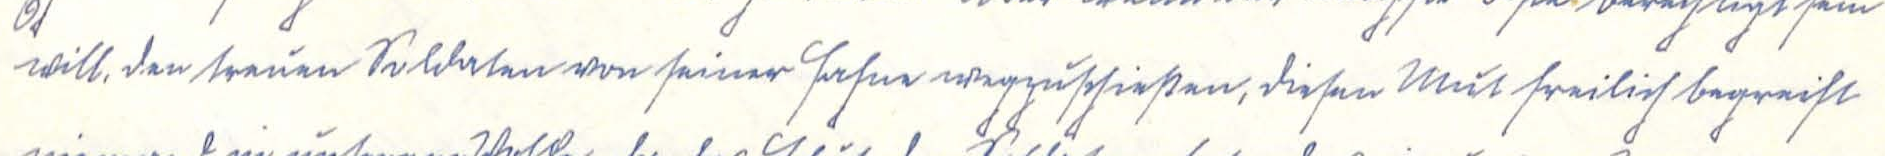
will, den treuen Soldaten von seiner Fahne wegzuschießen, diesen Mut freilich begreift
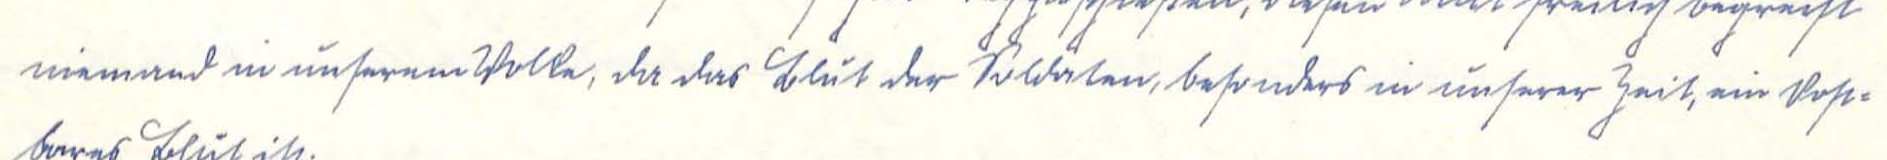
niemand in unserem Volke, da das Blut der Soldaten, besonders in unserer Zeit, ein kost-
